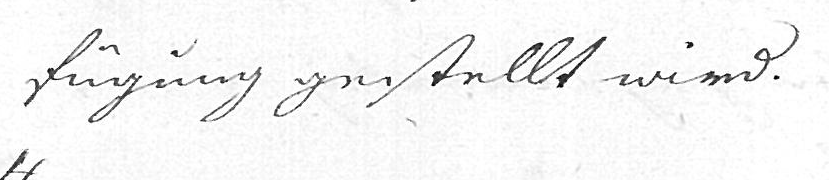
fügung gestellt wird.
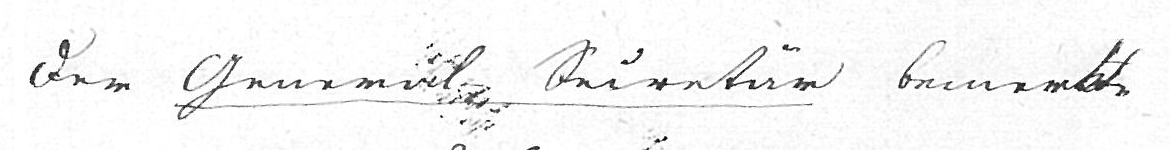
Der General-Secretär bemerkt
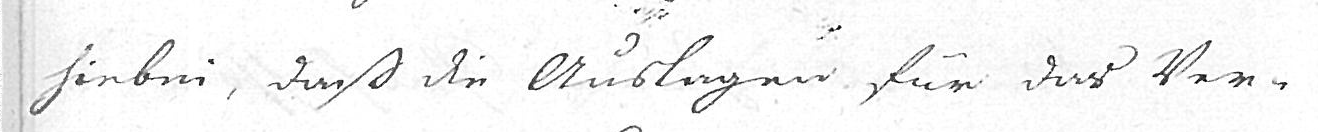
hiebei, daß die Auslagen für das Ver-
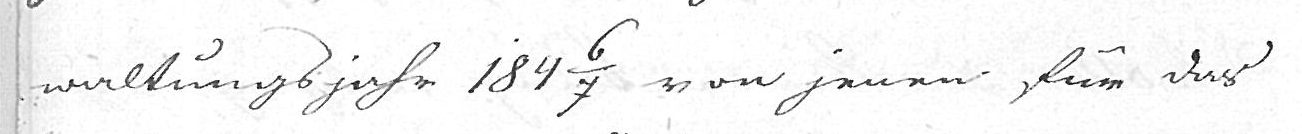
waltungsjahr 1846/7 von jenen für das
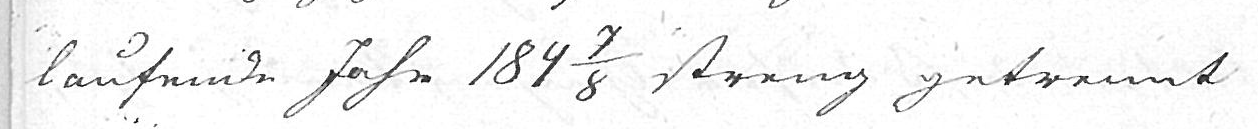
laufende Jahr 1847/8 streng getrennt
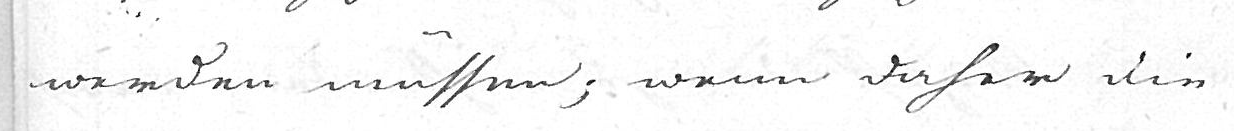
werden müssen; wenn daher die
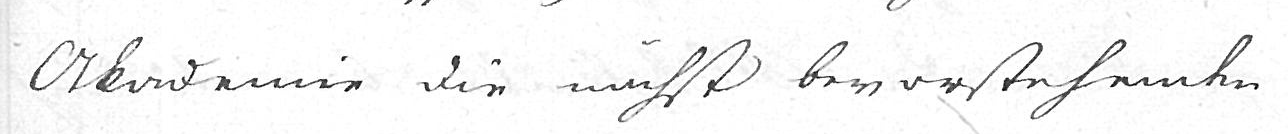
Akademie die nächst bevorstehenden
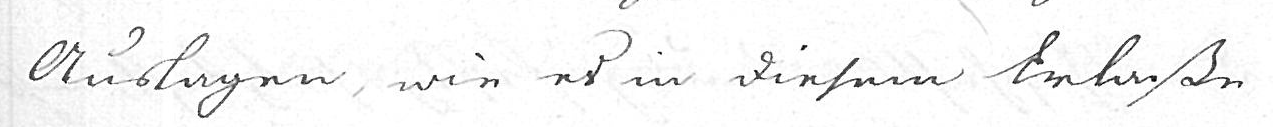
Auslagen, wie es in diesem Erlaße
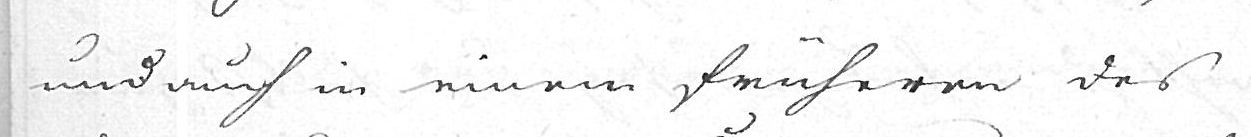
und auch in einem früheren des
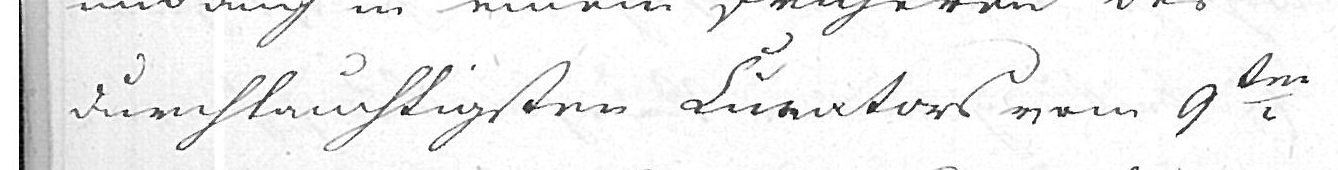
durchlauchtigsten Curators vom 9ten
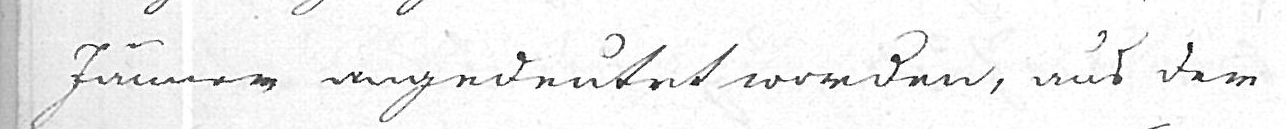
Jänner angedeutet worden, aus der
